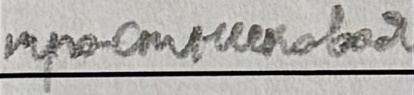тростниковая
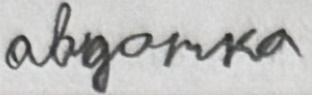авдотка
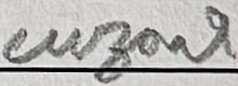сизая
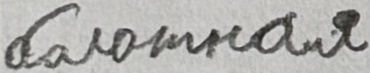балотная
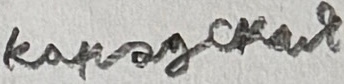конэдская
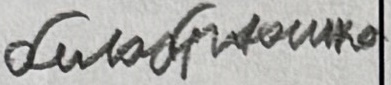белобрюшка
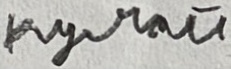кумай
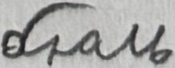бюль
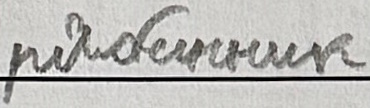рябинник
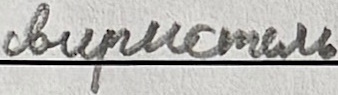свиристель
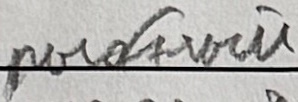рыбный
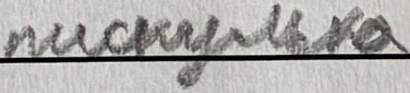пискулька
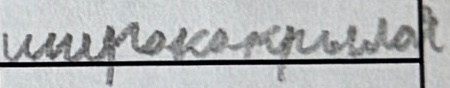ширококрылая
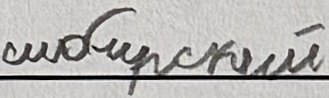сибирский
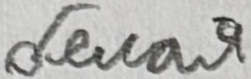белая
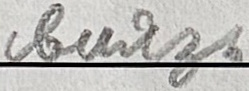свиязь
